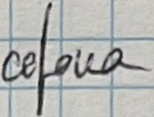сорока
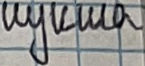кукша
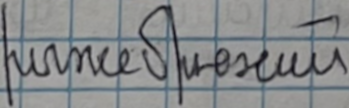рыжебрюхий
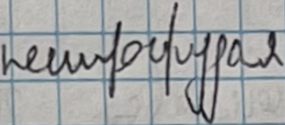пестрогрудая
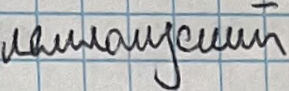лапландский
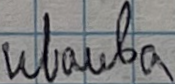кваква
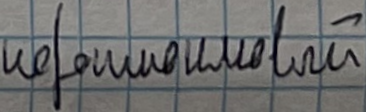короткоклювый
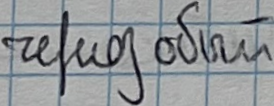чернозобый
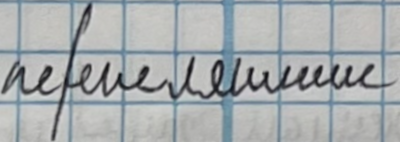перепелятник
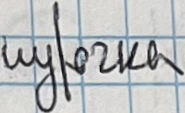курочка
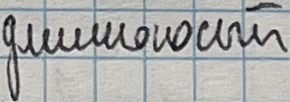длинноносый
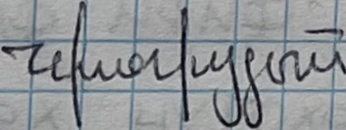черногрудый
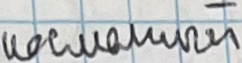косматый
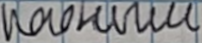погоныш
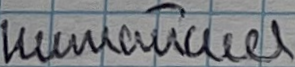китайская
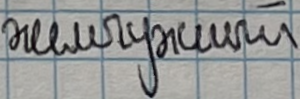жемчужный
